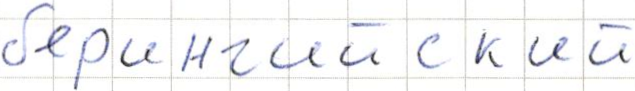берингийский
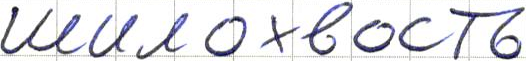шилохвость
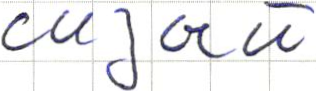сизый
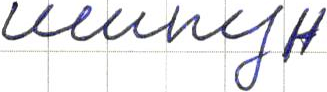шипун
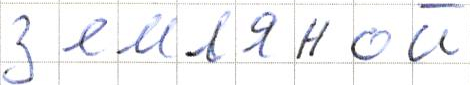земляной
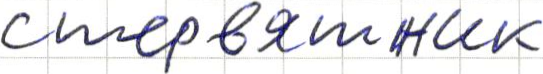стервятник
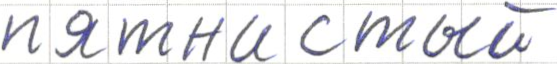пятнистый
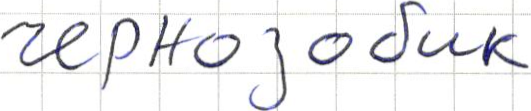чернозобик
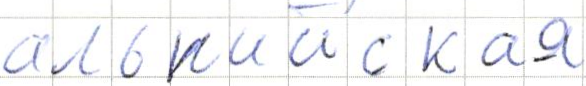альпийская
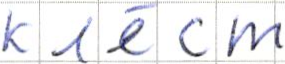клёст
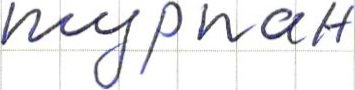турпан
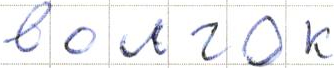волчок
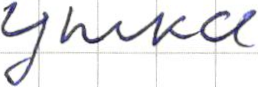утка
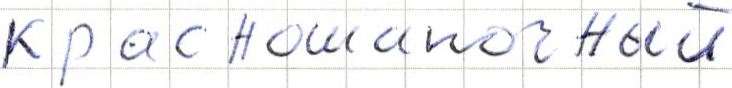красношапочный
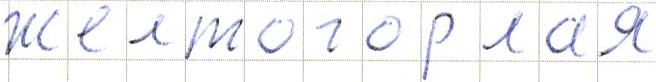желтогорлая
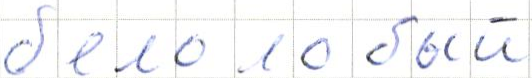белолобый
